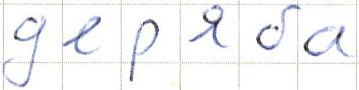деряба
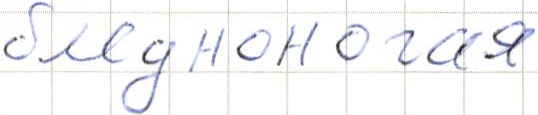бледноногая
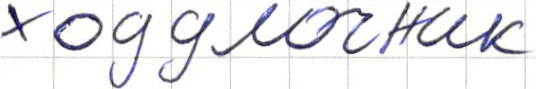ходулочник
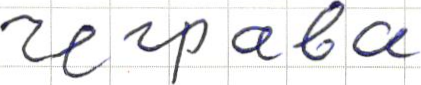чеграва
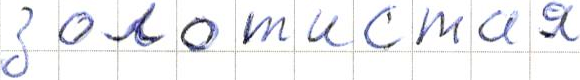золотистая
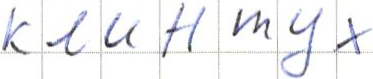клинтух
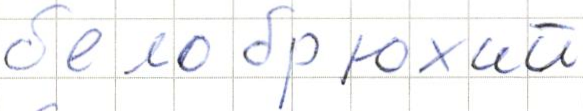белобрюхий
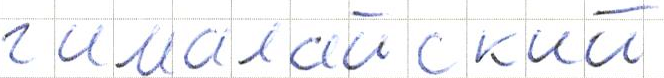гималайский
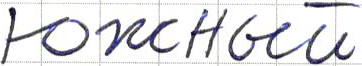южный
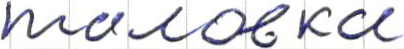таловка
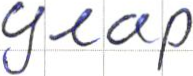улар
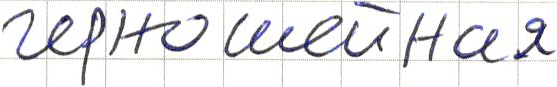черношейная
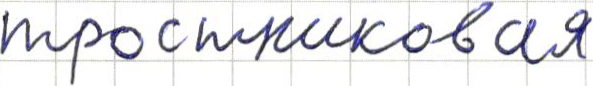тростниковая
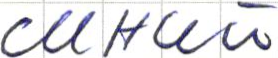синий
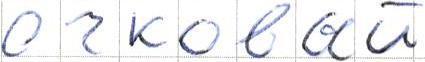очковый
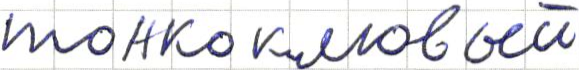тонкоклювый
